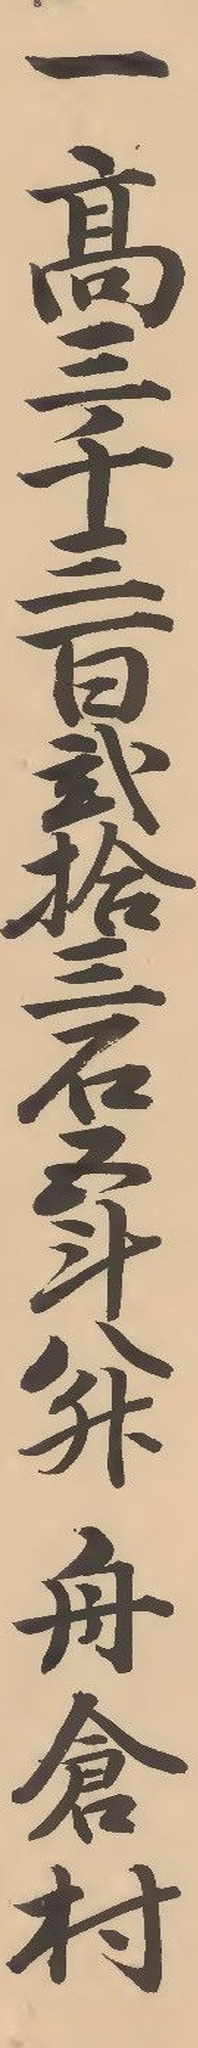一高三千三百弐拾三石五斗八升舟倉村
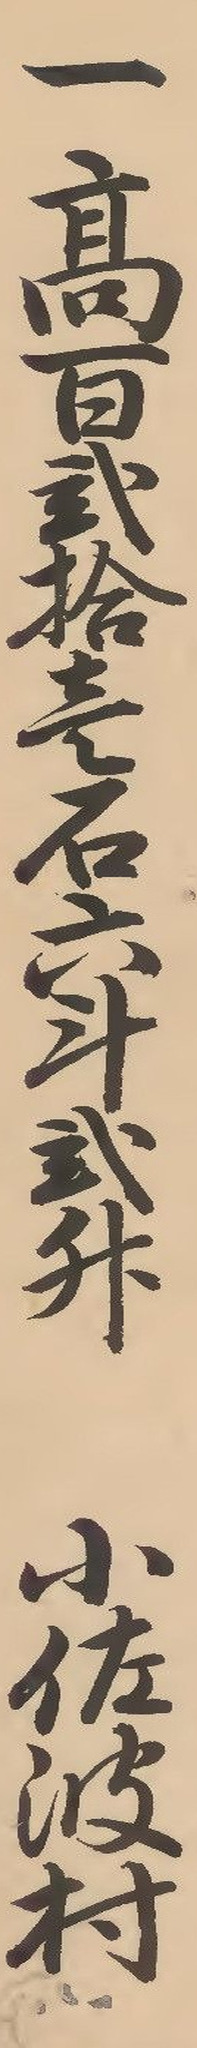一高百弐拾壱石六斗弐升小佐波村

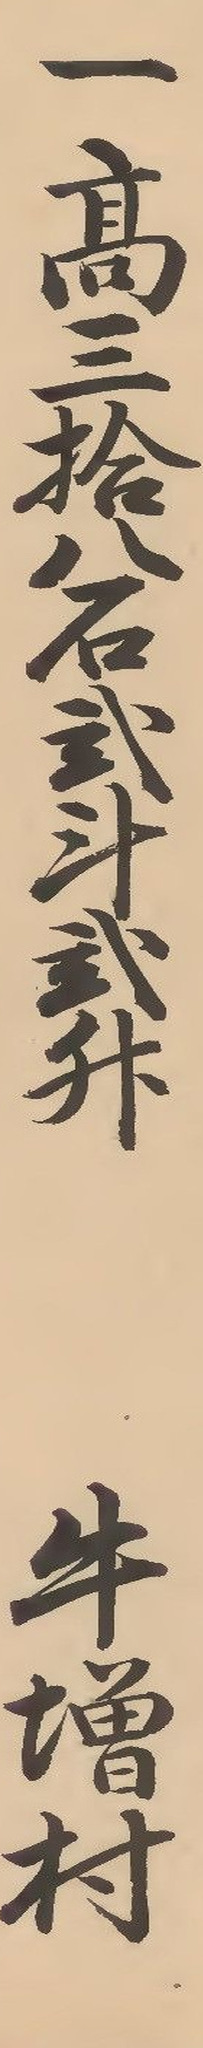一高三拾八石弐斗弐升牛増村
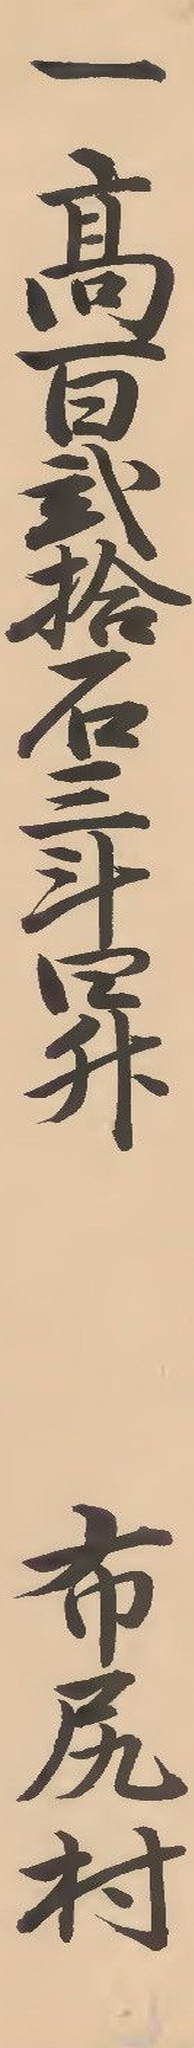一高百弐拾石三斗四升布尻村
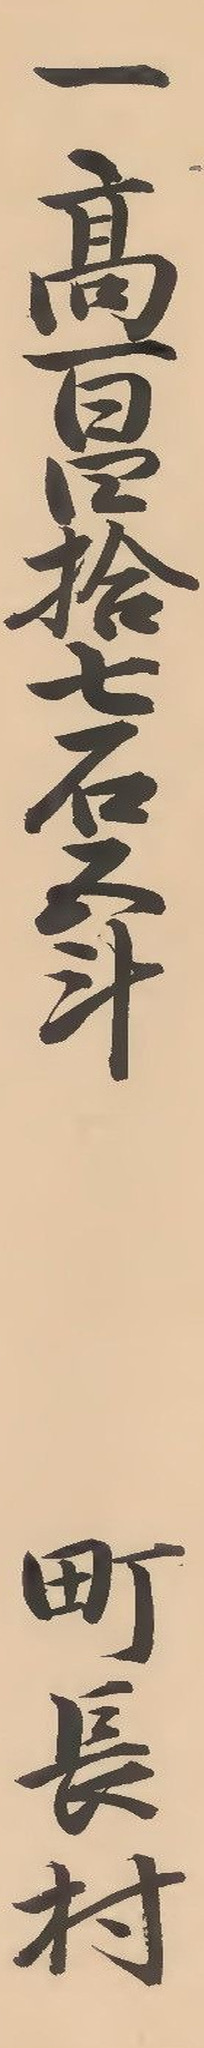一高百四拾七石五斗町長村
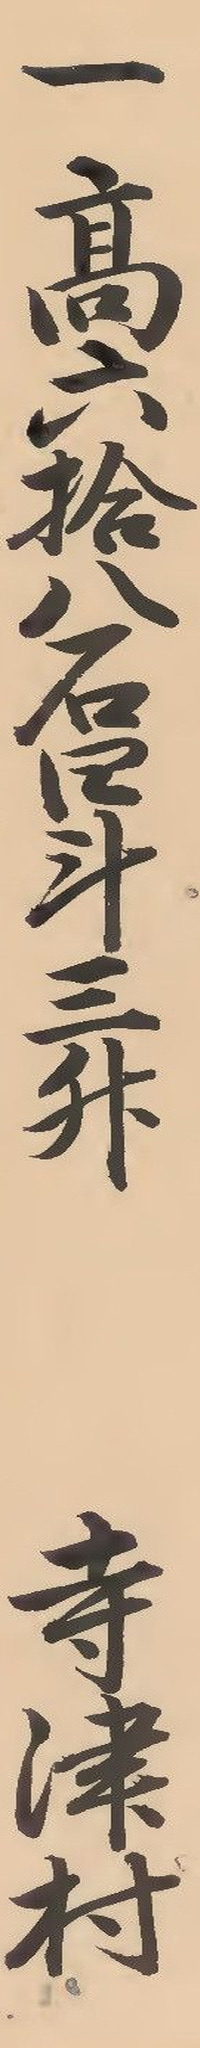一高六拾八石四斗三升寺津村

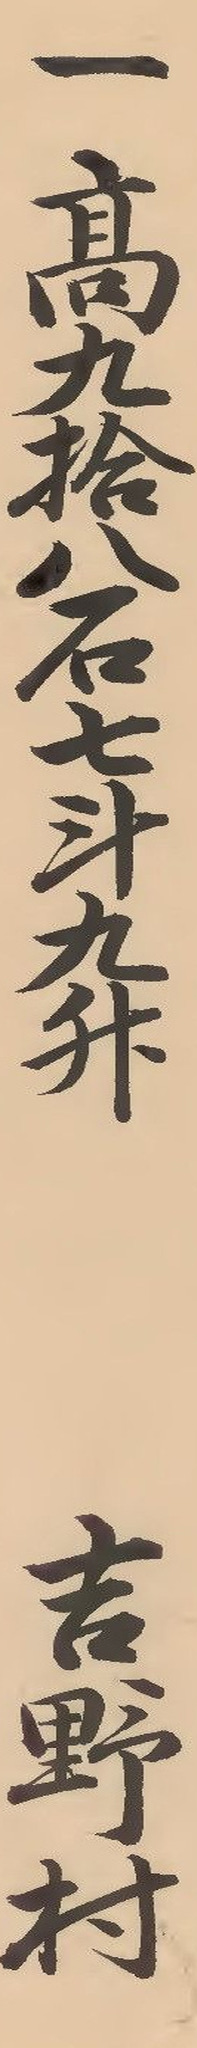一高九拾八石七斗九升吉野村
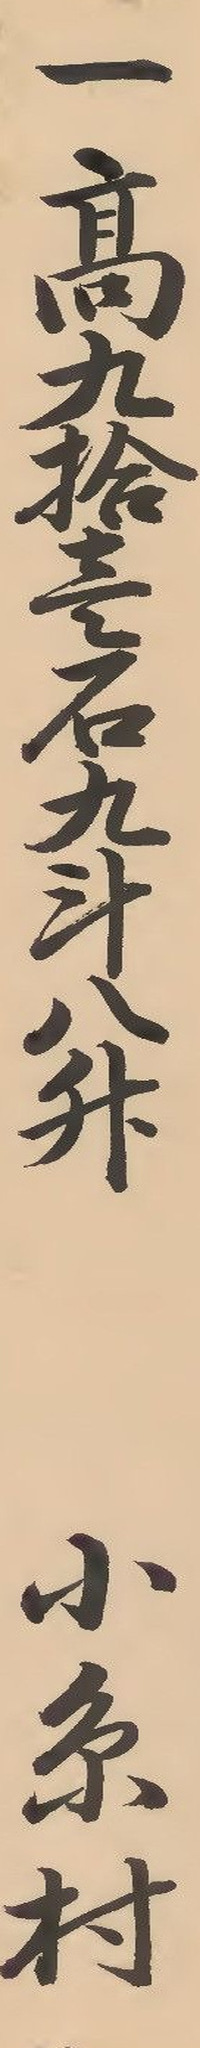一高九拾壱石九斗八升小糸村

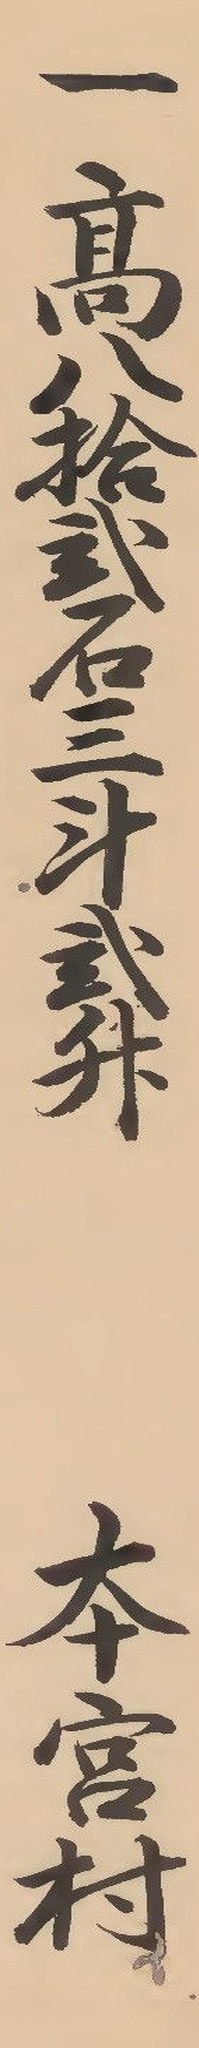一高八拾弐石三斗弐升本宮村
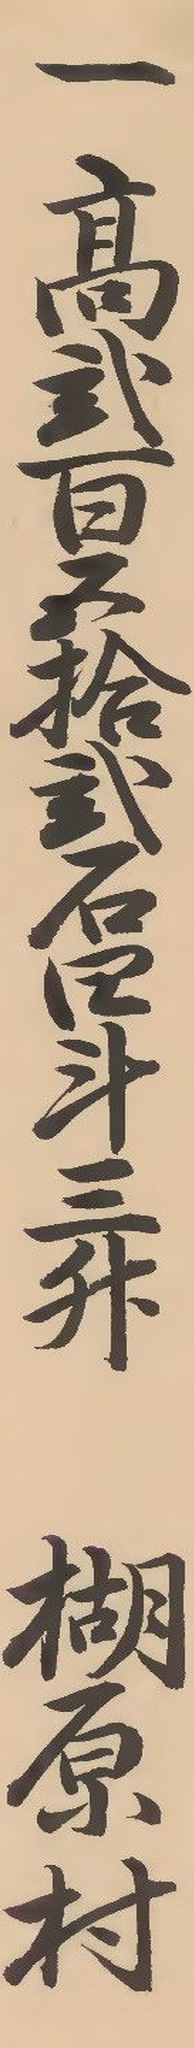一高弐百五拾弐石四斗三升楜原村
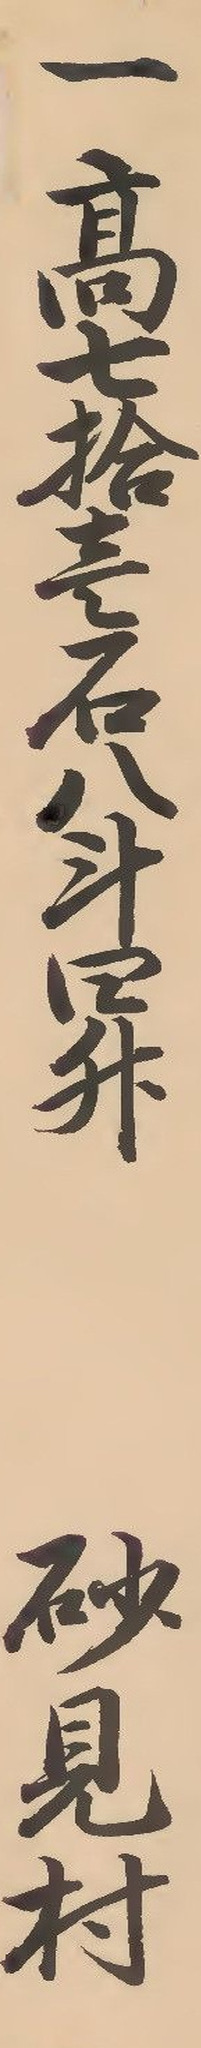一高七拾壱石八斗四升砂見村
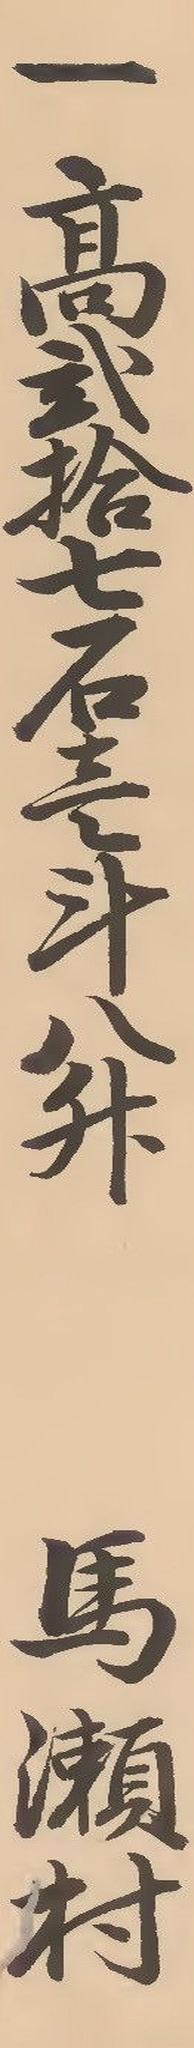一高弐拾七石壱斗八升馬瀬村
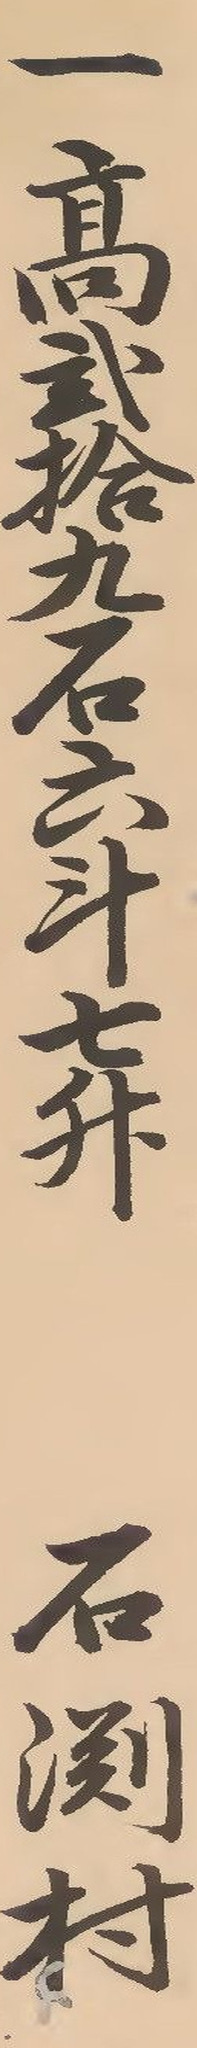一高弐拾九石六斗七升石渕村

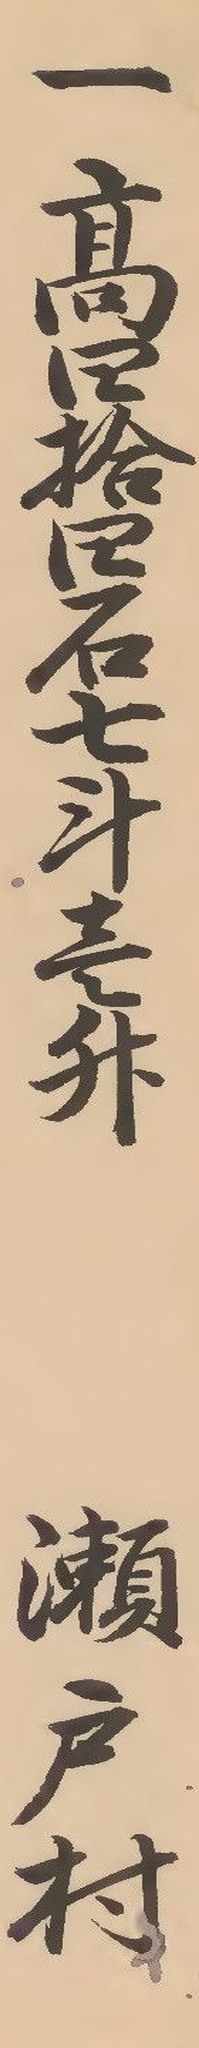一高四拾四石七斗壱升瀬戸村
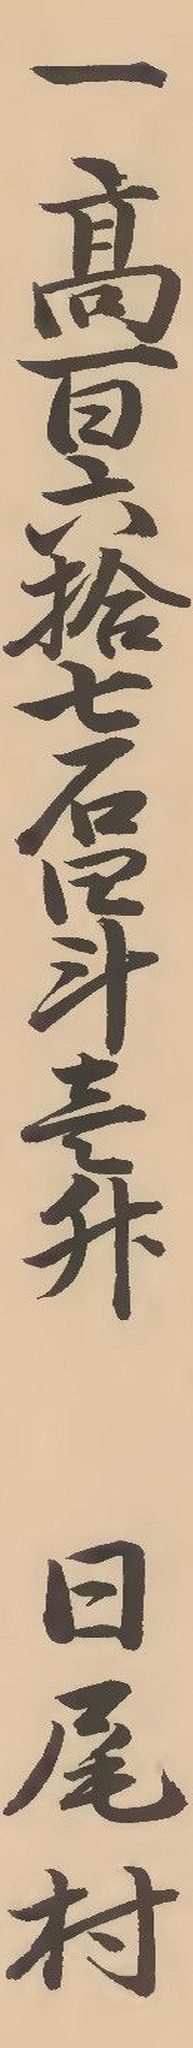一高百六拾七石四斗壱升日尾村
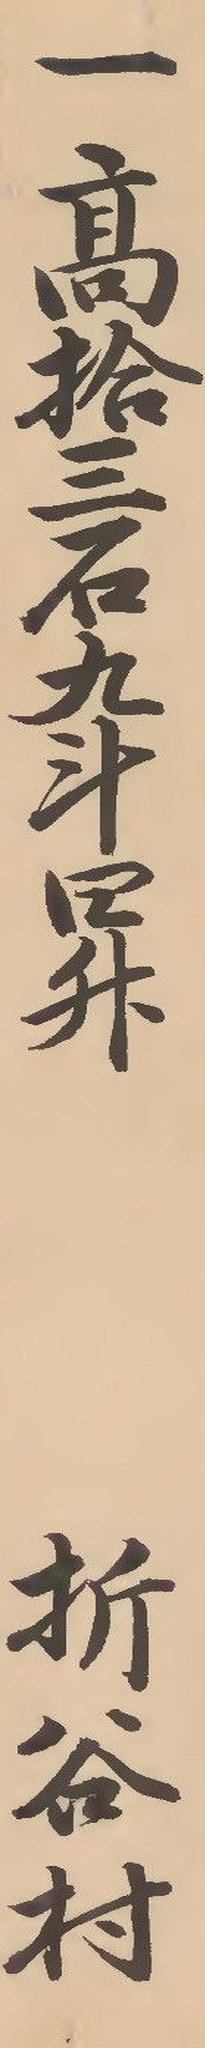一高拾三石九斗四升折谷村
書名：越中国郷帳
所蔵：国立公文書館 National Archives of Japan
